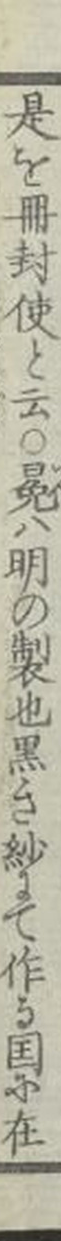是を冊封使と云○冕は明の製也黒き紗にて作る国に在
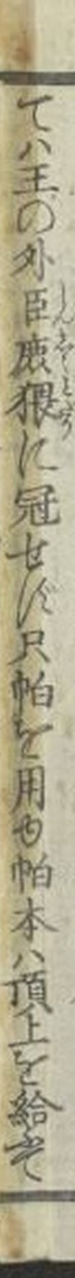ては王の外臣鹿猥に冠せず只帕を用ゆ帕本は頂上を給ふて
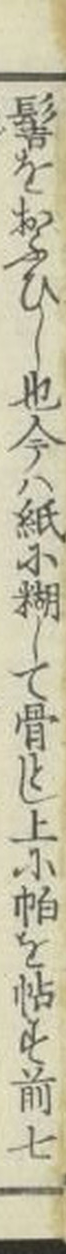髻をおふひし也今は紙に糊して骨とし上に帕を帖す前七
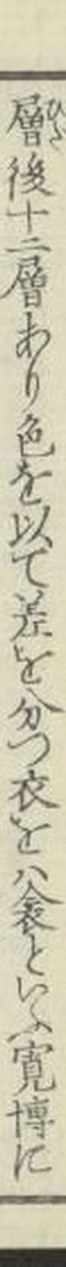層後十二層あり色を以て差を分つ衣をは衾といふ寛博に
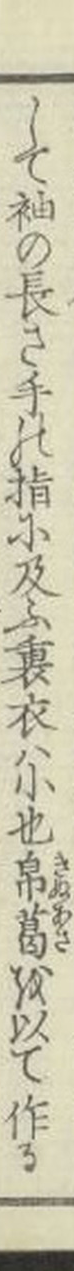して袖の長さ手の指に及ふ裏衣は小也帛葛を以て作る
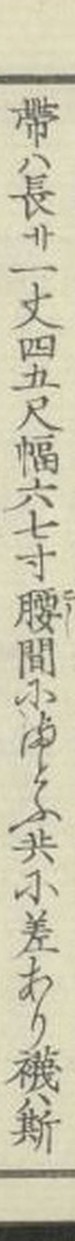帯は長サ一丈四五尺幅六七寸腰間にまとふ共に差あり襪は斯
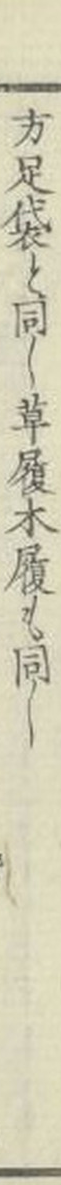方足袋と同し草履木履も同し
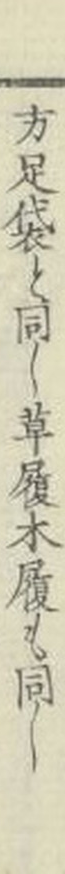方足袋と同し草履木履も同し

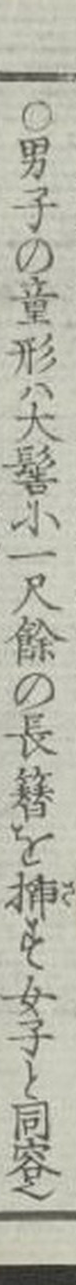○男子の童形は大髻に一尺余の長簪を挿す女子と同容也
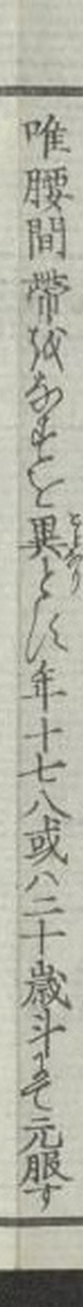唯腰間帯をなすを異とす年十七八或は二十歳斗にて元服す
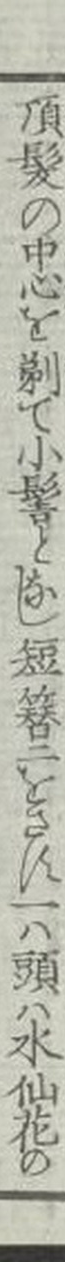頂髪の中心を剃て小髻となし短簪二をさす一は頭は水仙花の
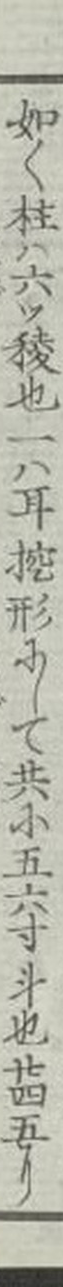如く柱は六ツ稜也一は耳控形にして共に五六寸斗也卄四五に
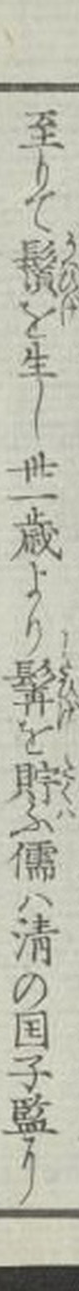至りて鬚を生し卅一歳より髯を貯ふ儒は清の国子監に
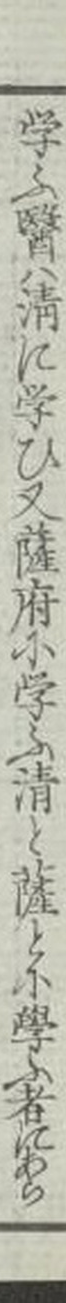学ふ医は清に学ひ又薩府に学ふ清と薩とに学ふ者にあら
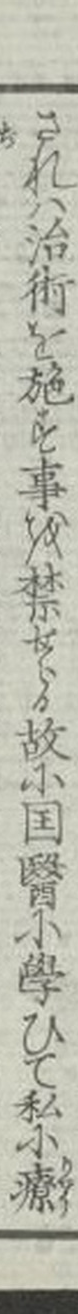されは治術を施す事を禁せらる故に国医に学ひて私に療
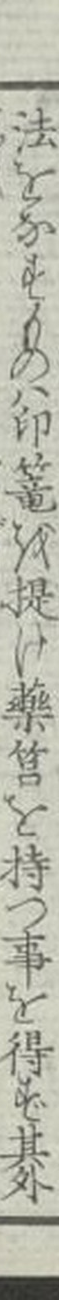法をなすものは印篭を提け薬筥を持つ事を得ず其外
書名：中山国使略
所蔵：University of the Ryukyus Library
